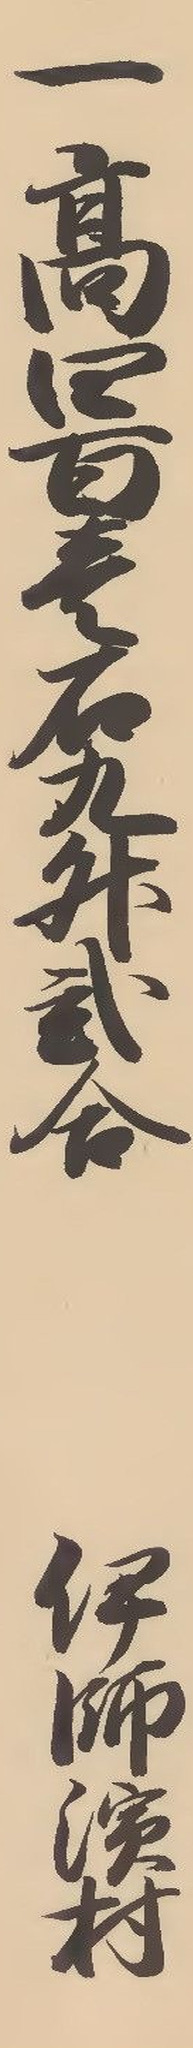一高四百壱石九升弐合伊師浜村
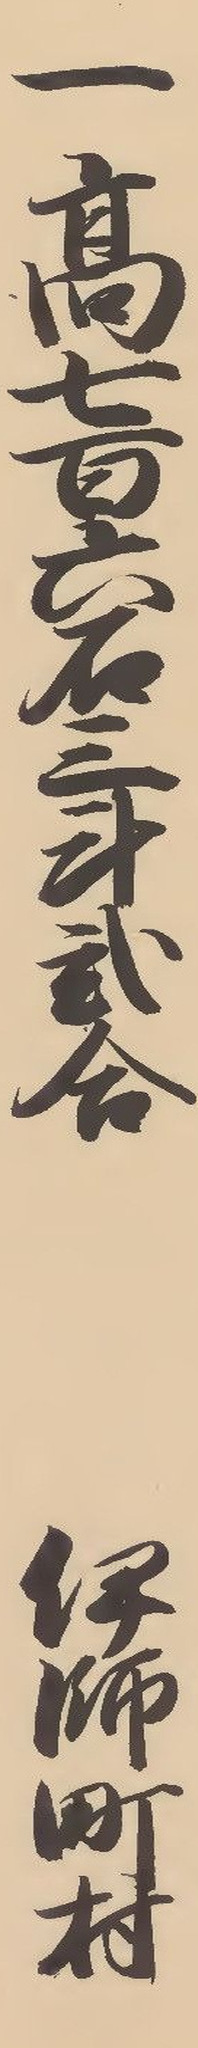一高七百六石三斗弐合伊師町村
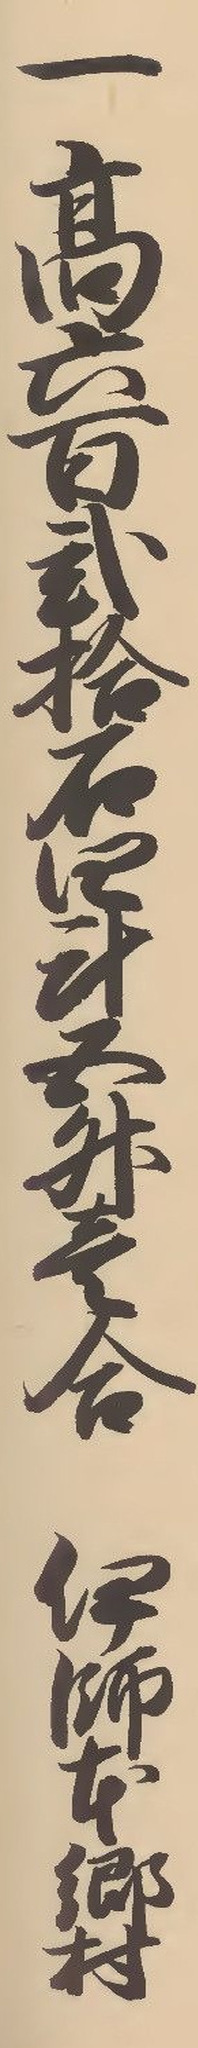一高六百弐拾石四斗五升壱合伊師本郷村
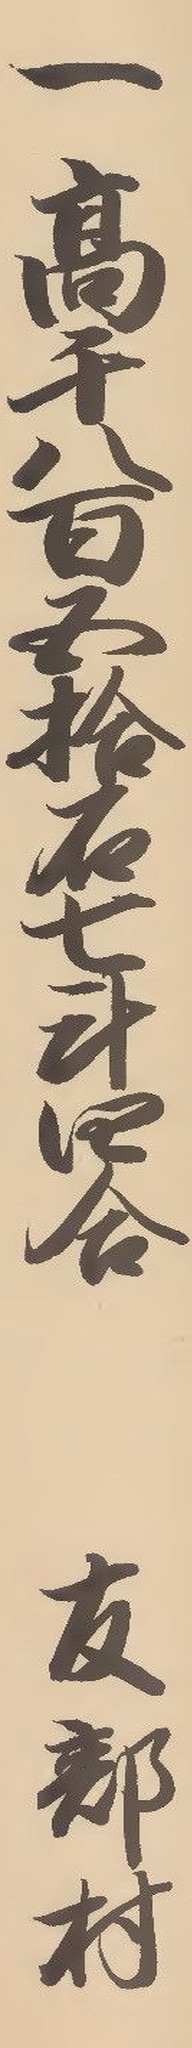一高千八百五拾石七斗四合友部村
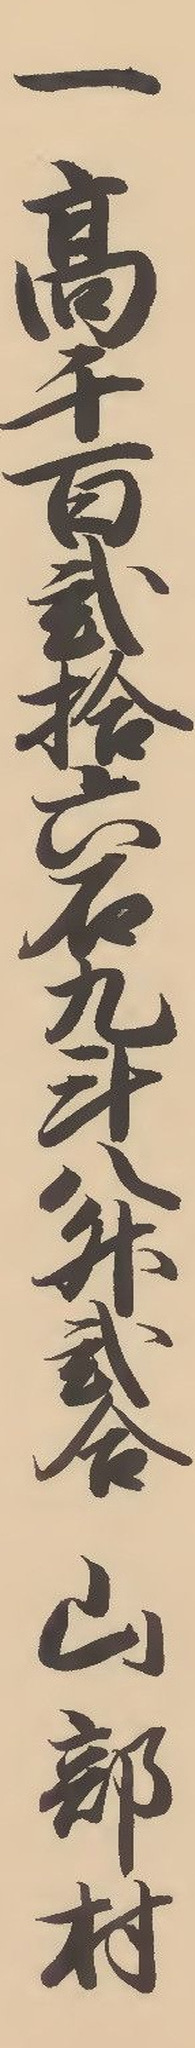一高千百弐拾六石九斗八升弐合山部村
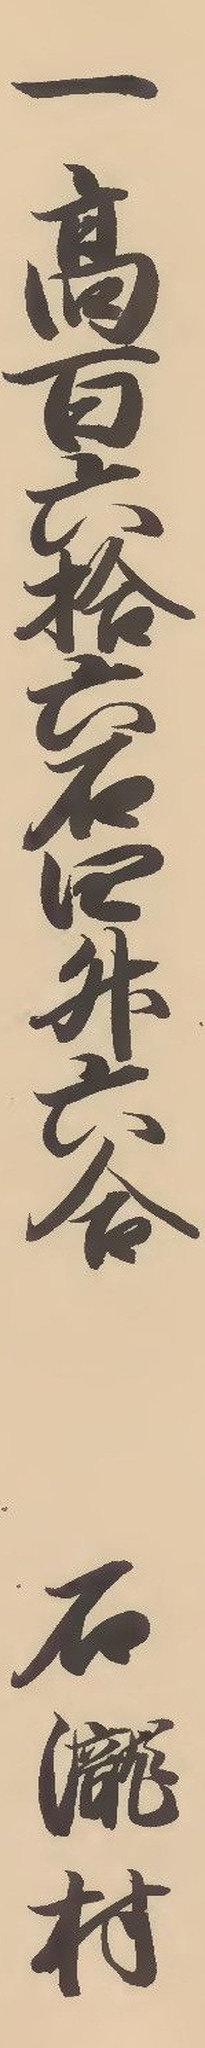一高百六拾六石四升六合石滝村
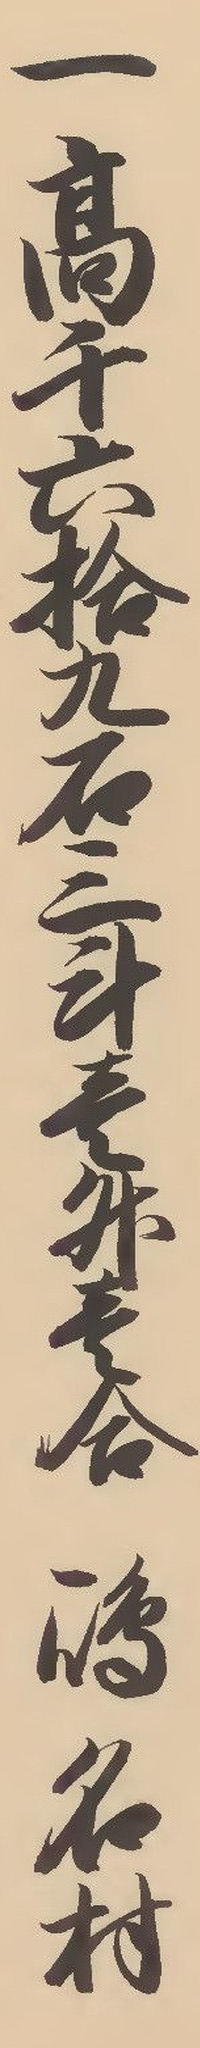一高千六拾九石三斗壱升壱合島名村

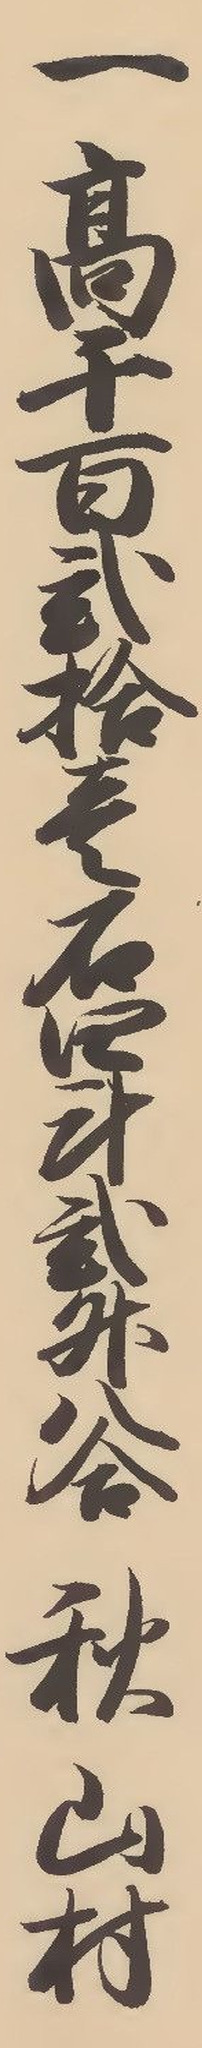一高千百弐拾壱石四斗弐升八合秋山村
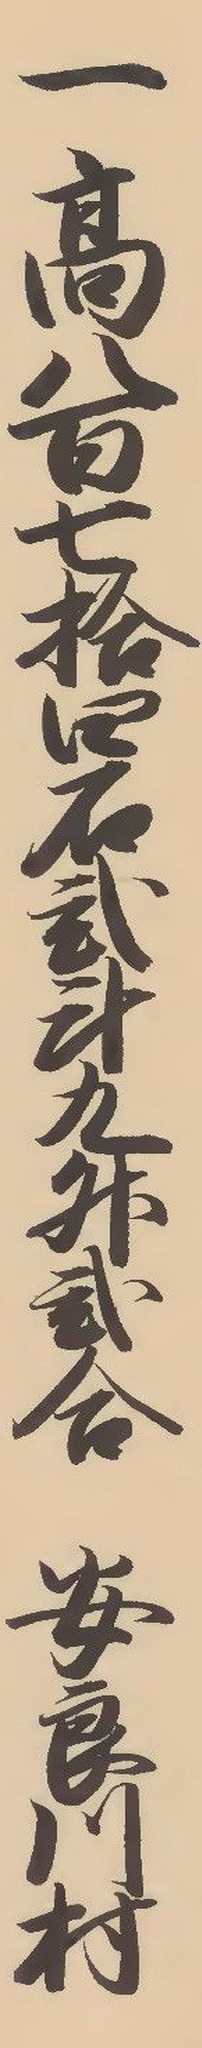一高八百七拾四石弐斗九升弐合安良川村
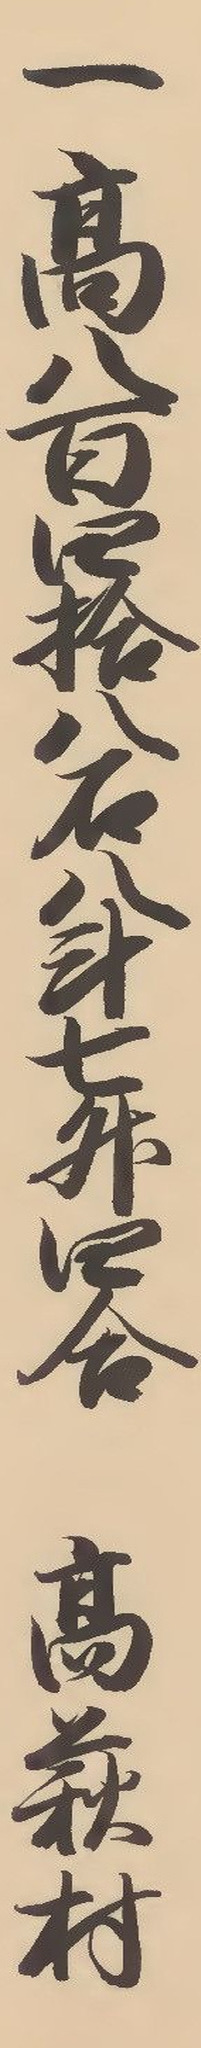一高八百四拾八石八斗七升四合高萩村
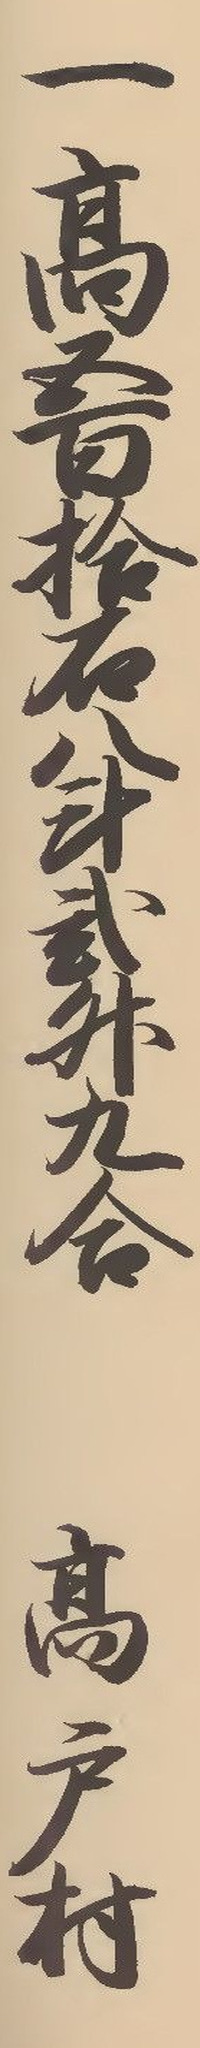一高五百拾石八斗弐升九合高戸村
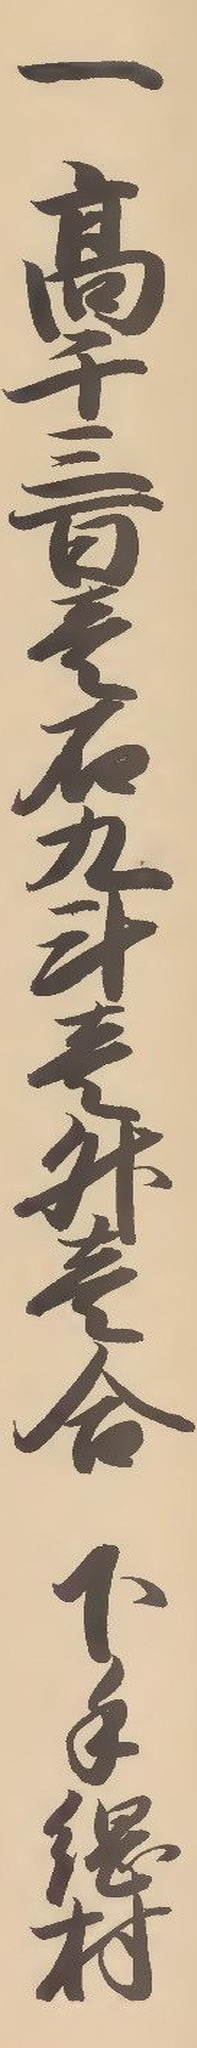一高千三百壱石九斗壱升壱合下手綱村
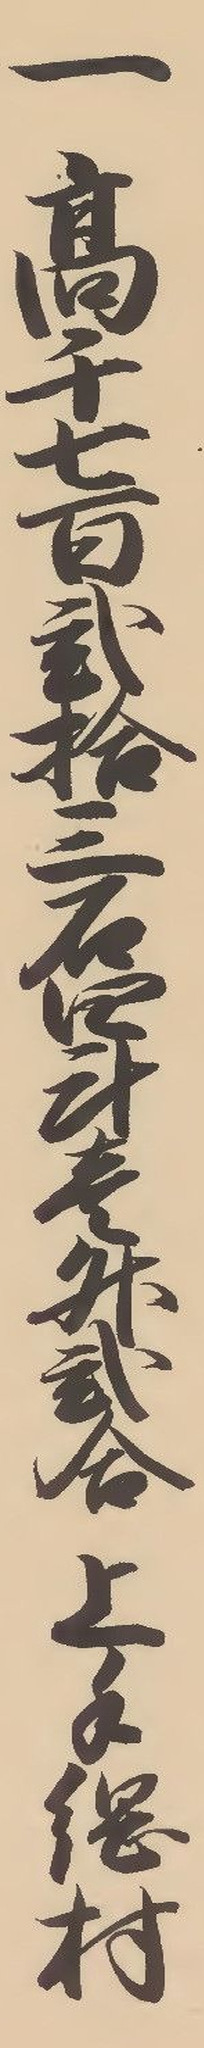一高千七百弐拾三石四斗壱升弐合上手綱村
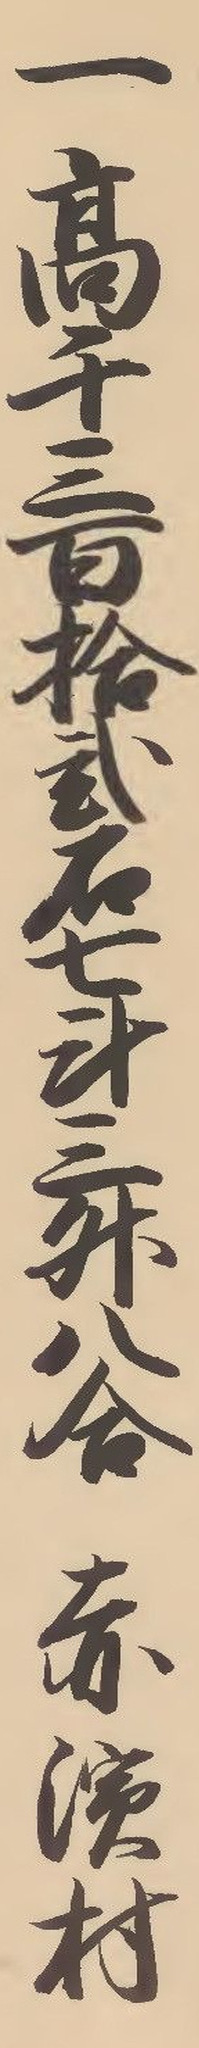一高千三百拾弐石七斗三升八合赤浜村
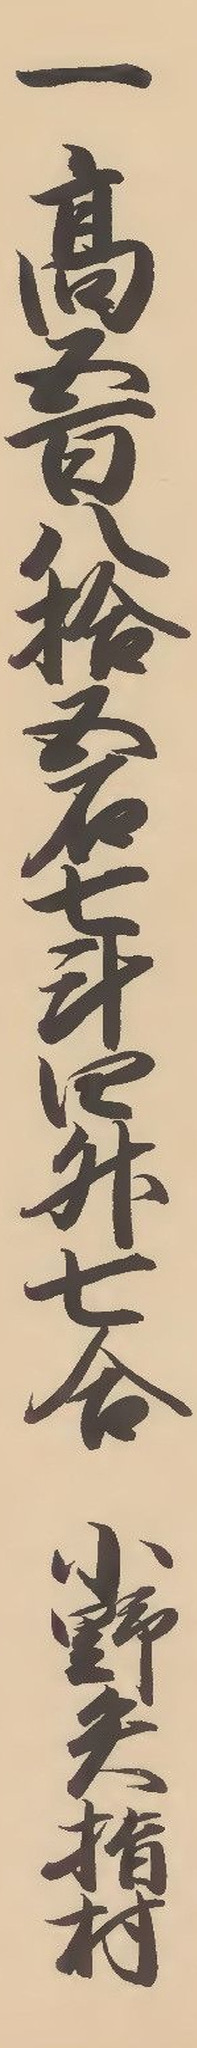一高五百八拾五石七斗四升七合小野矢指村

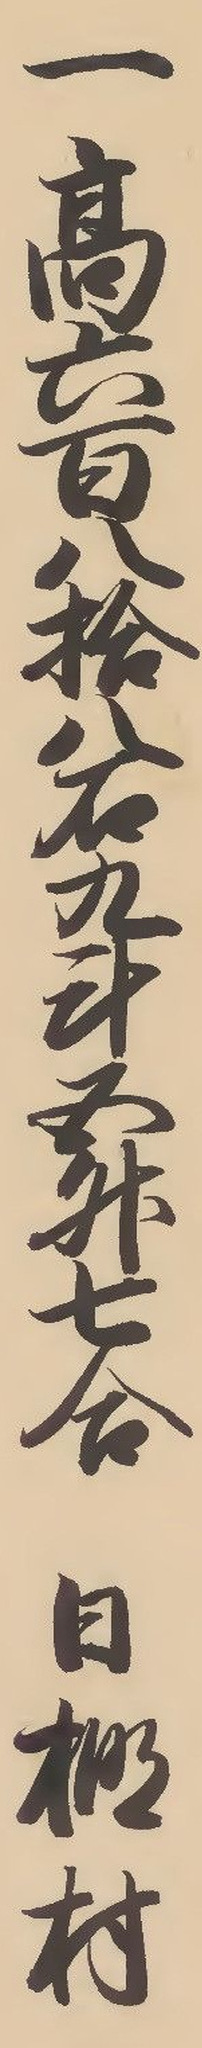一高六百八拾八石九斗五升七合日棚村
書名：常陸国郷帳
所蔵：国立公文書館 National Archives of Japan
